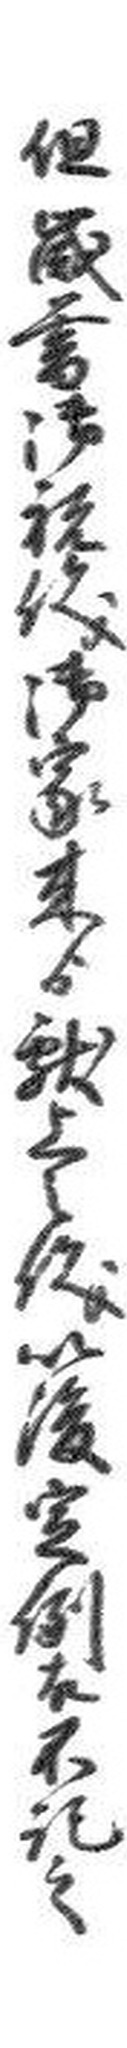但歳暮御祝儀御家来ゟ献上之儀以後定例故不記之
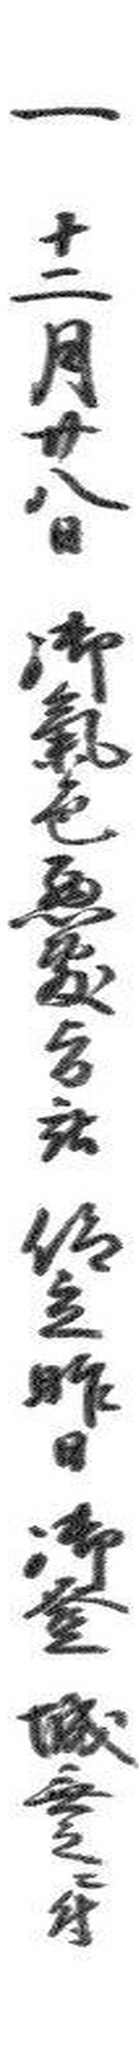一十二月廿八日御気色悪敷旨被仰立昨日御登城無之ニ付
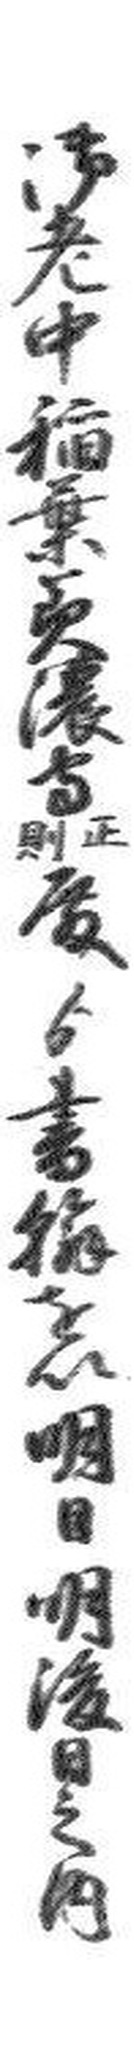御老中稲葉美濃守正則殿ゟ書翰を以明日明後日之内
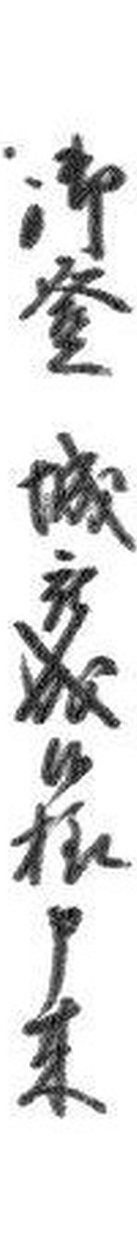御登城被成候様申来
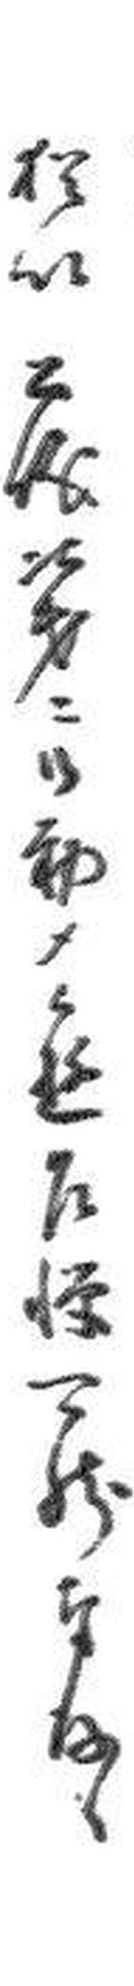猶以公儀次第ニ御勤メ被遊乍憚可然奉存候
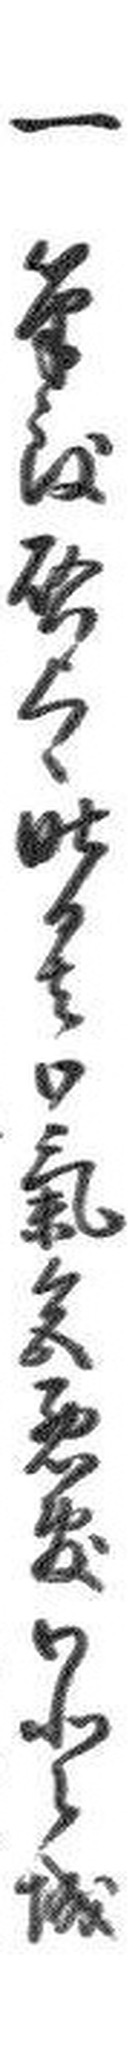一筆致啓上候昨日者御気色悪敷御登城
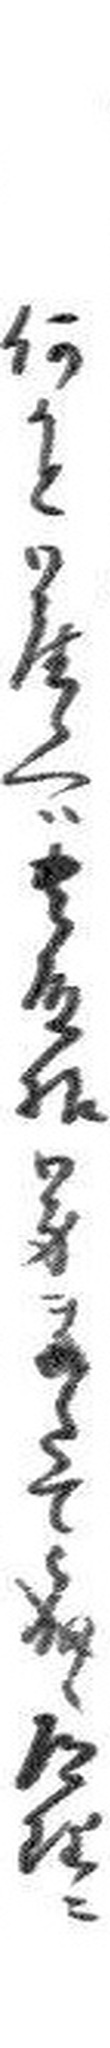何かと御座候へㇵ貴殿様御身ヲ御立て被成候道理ニ
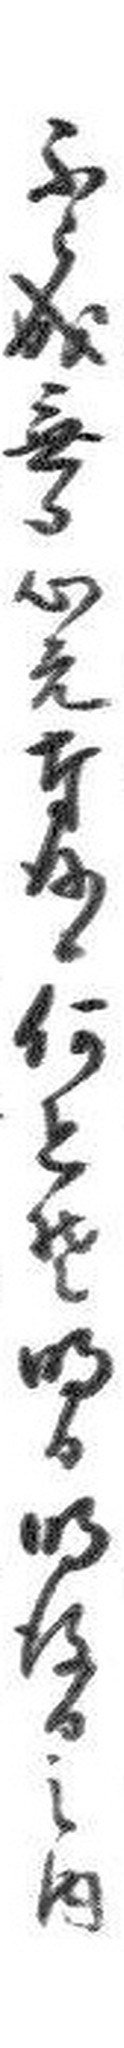不被成無御心元奉存候何とそ明日明後日之内
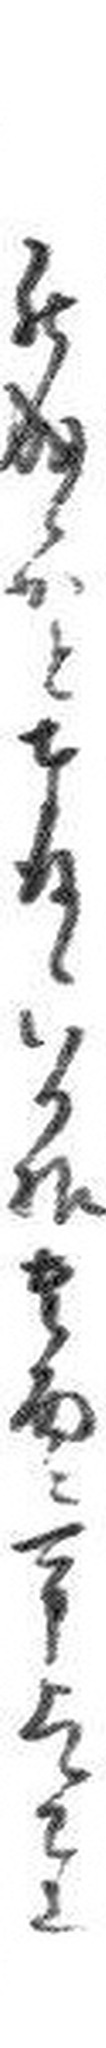罷成候かと奉存候いか様貴殿ニ可申上候已上
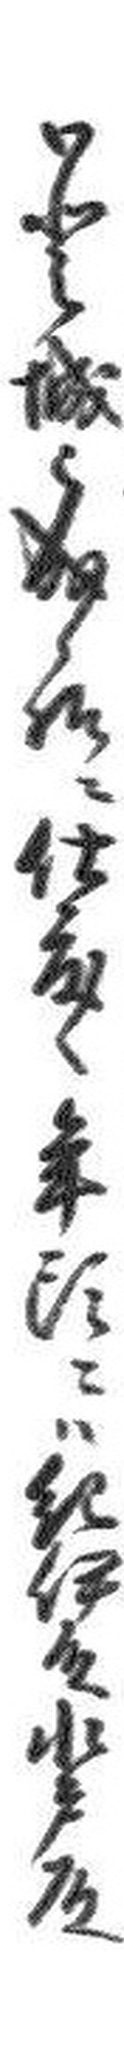御登城被成候様ニ仕度候年頭ニハ紀伊殿水戸殿
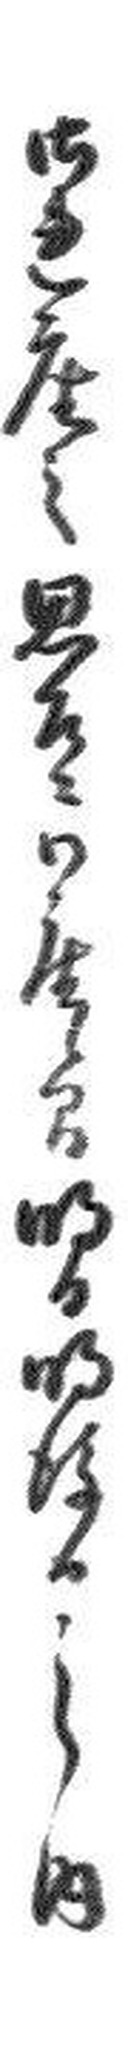御連座之思召ニ御座候間明日明後日之内

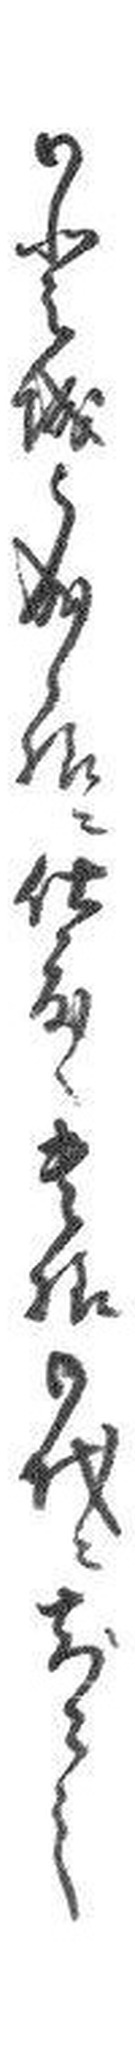御登城被成候様ニ仕度候貴様御代ニ前々之
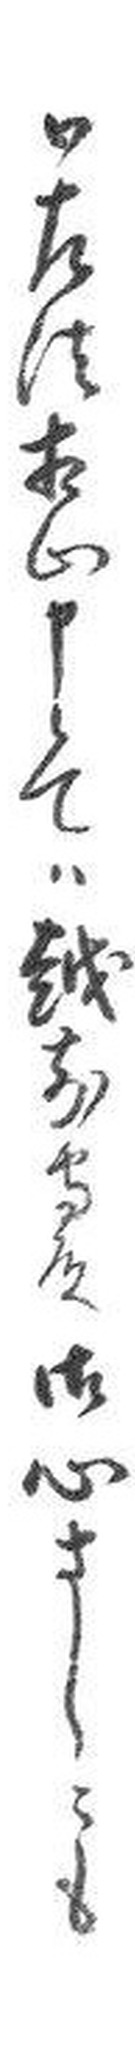御左法相止申候てハ越前守殿御心さしニも
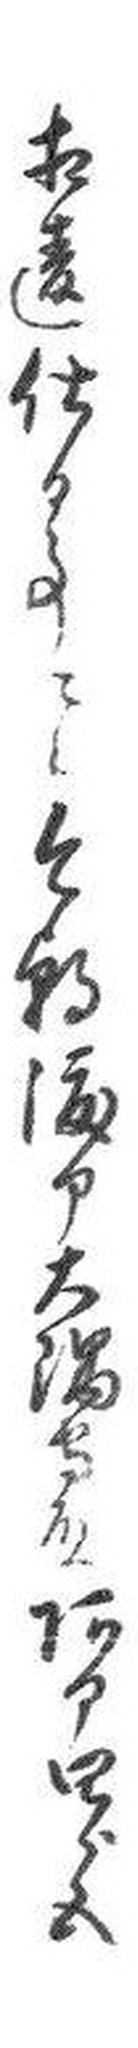相違仕る事ニ候今朝渡部大隅殿阿部四郎五
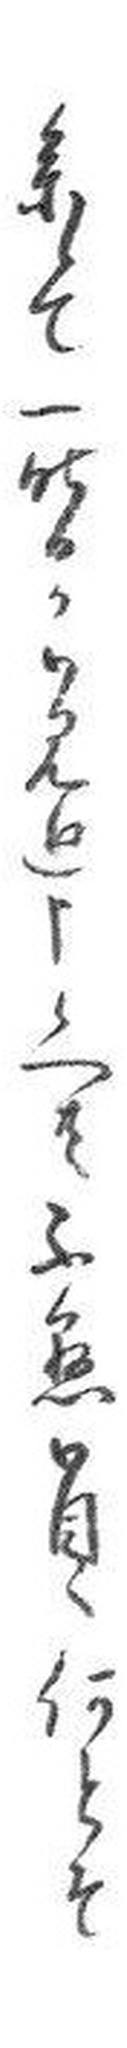参候て一昨日ヵ御見廻申候ヘ共不懸御目候何とそ
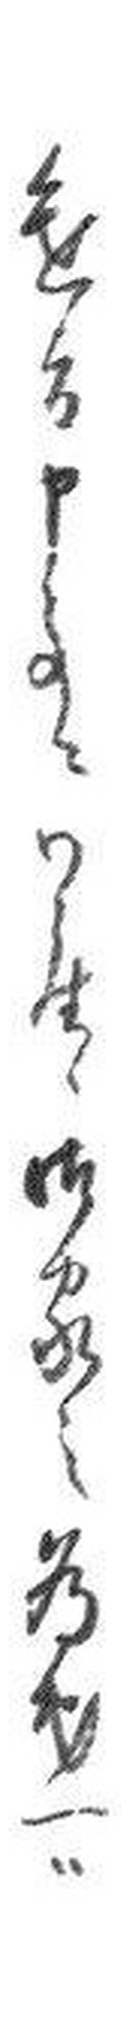遣旨申事ニ御座候御家之為第一ハ
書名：家譜 十一 昌親公 従延宝二年到延宝四年八月
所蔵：福井県文書館 Fukui Prefectural Archives
